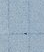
nicht zu
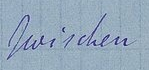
zwei Zügen
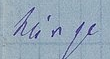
ich nach
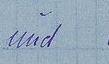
Zürich.
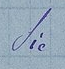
ich
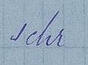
Ihnen
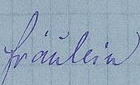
verfügen
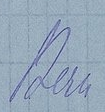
Sie
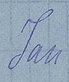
über
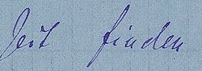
Sie wieder
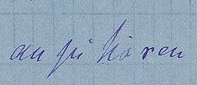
Meine herzlichsten
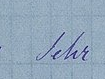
Grüsse
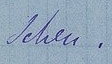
E Welti
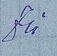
Bern
